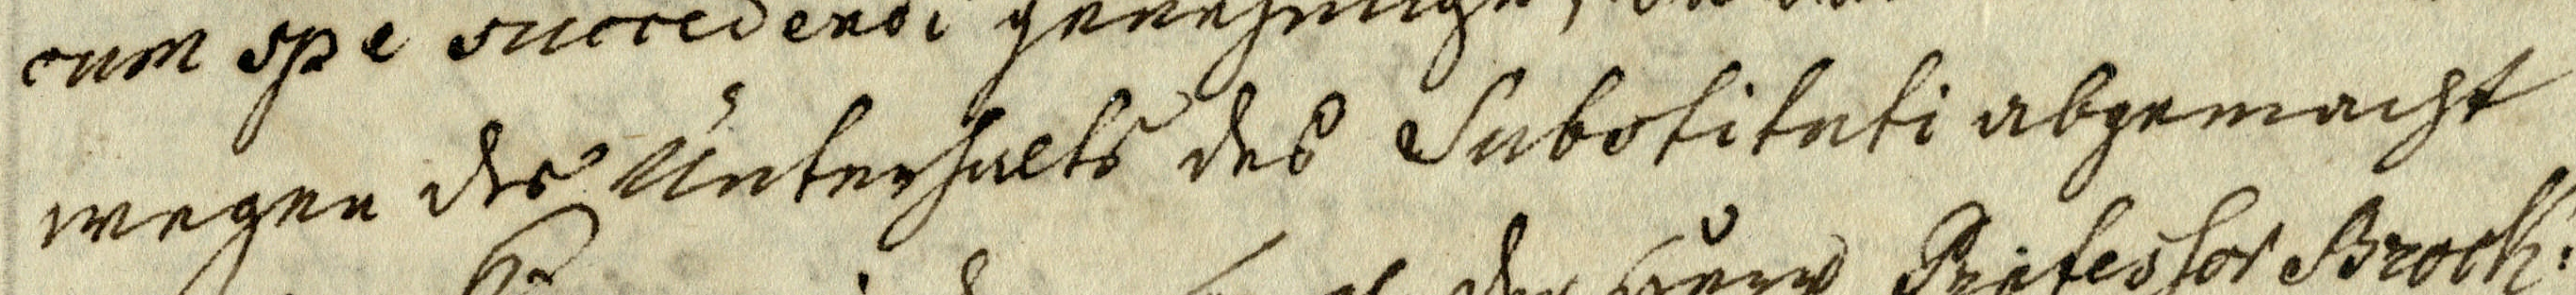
wegen des Unterhalts des Substituti abgemacht
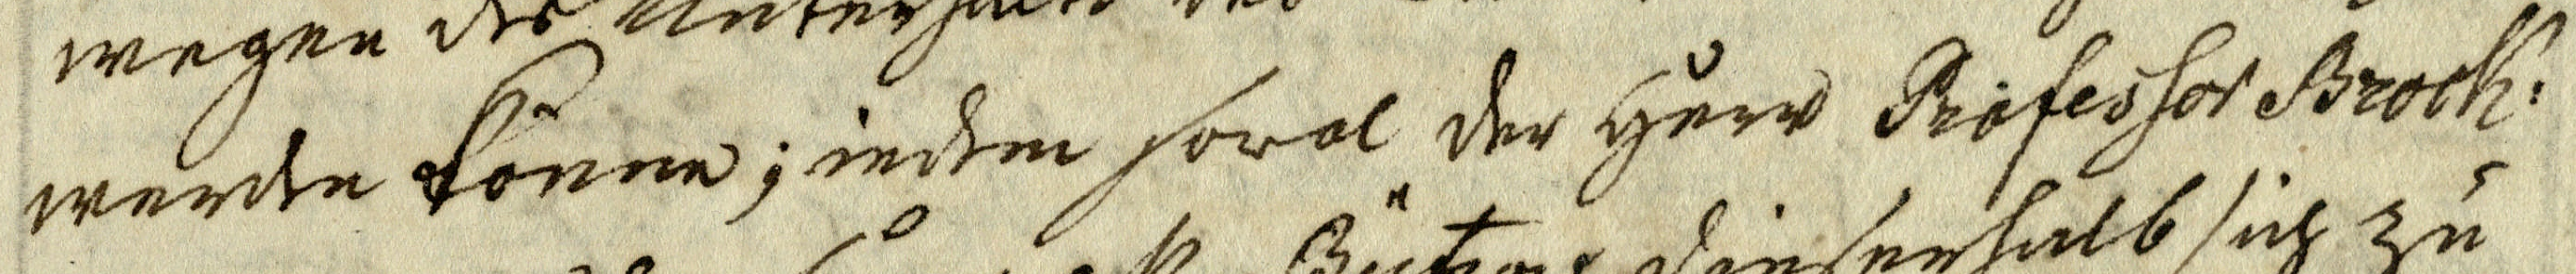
werden könne; in dem sowol der Herr Professor Brock¬
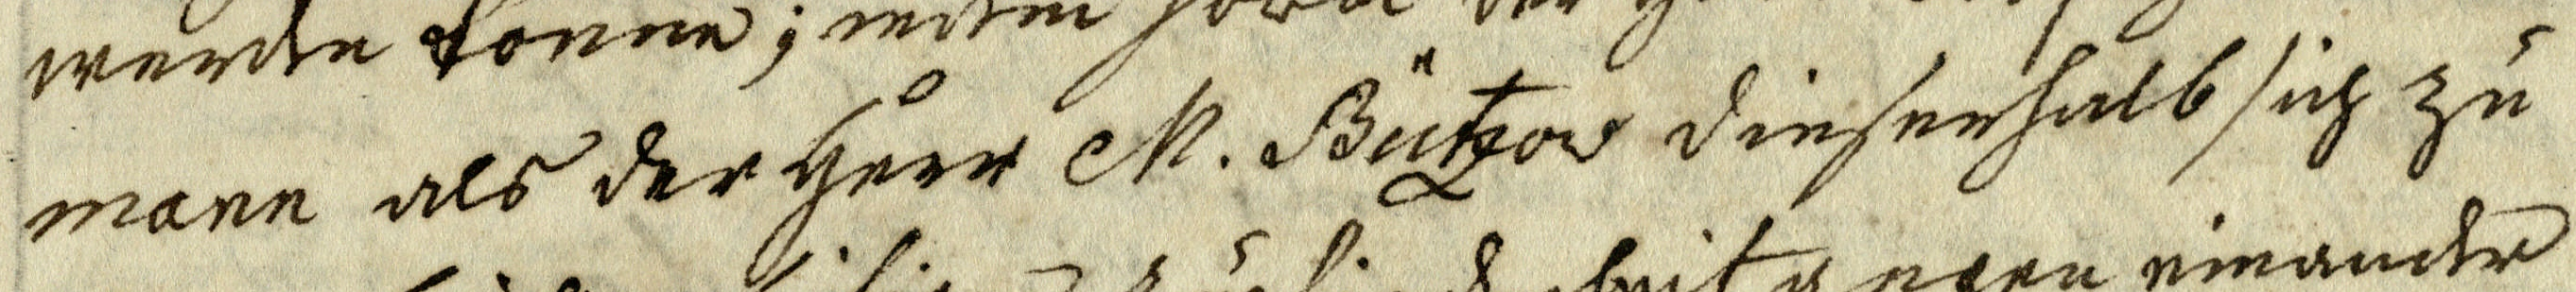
mann als der Herr M. Bützow dieserhalb sich zu
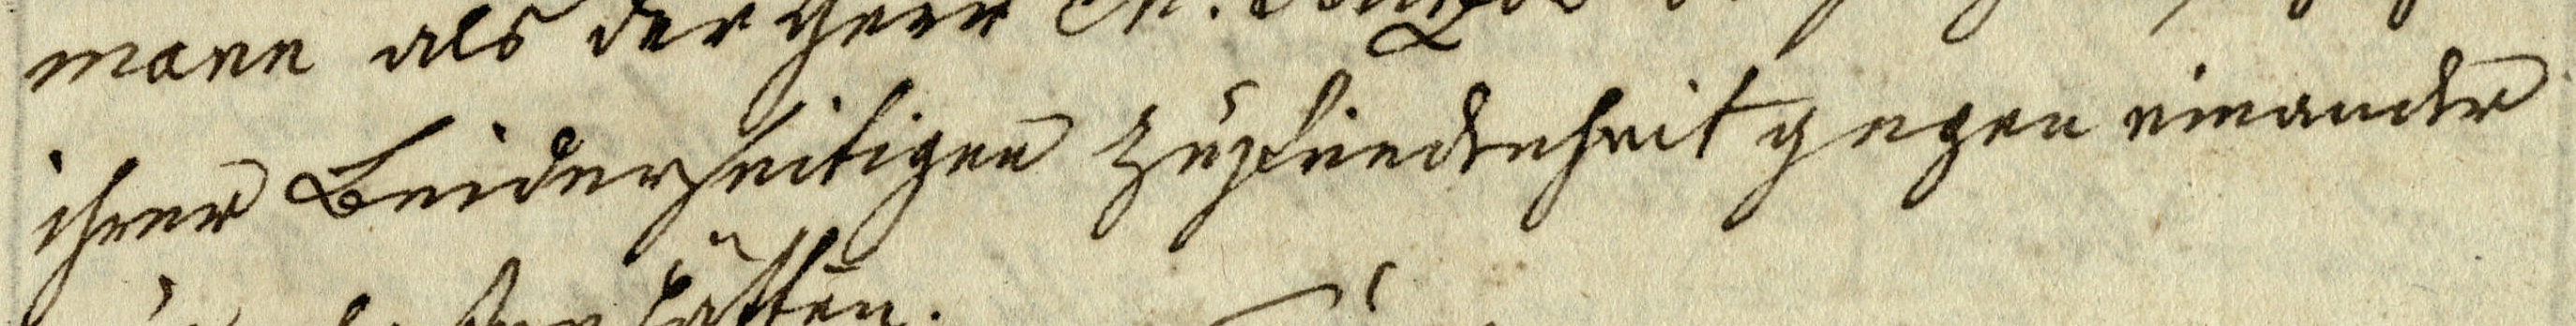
ihrer beiderseitigen Zufriedenheit gegen einander
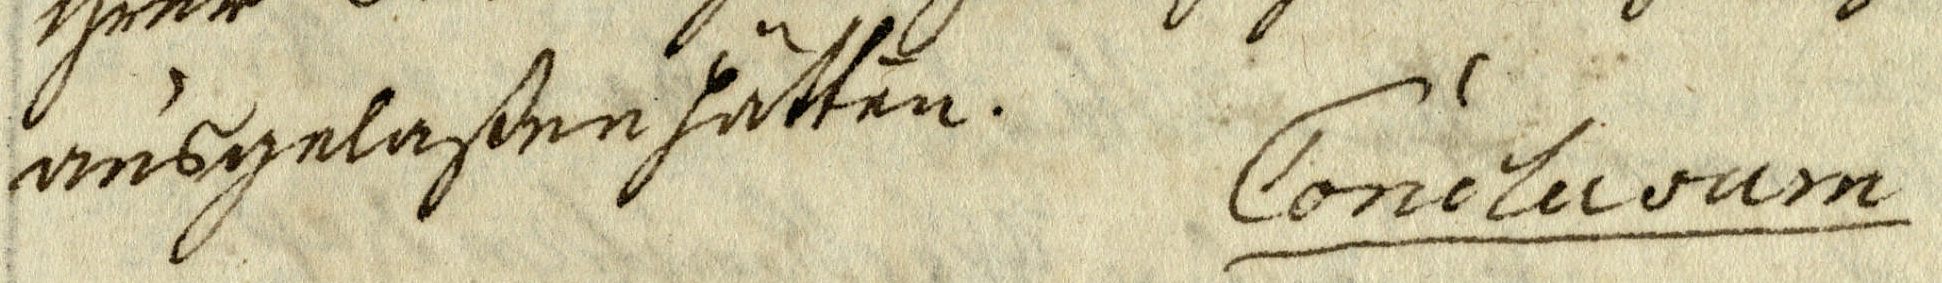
ausgelaßen hätten. Conclusum
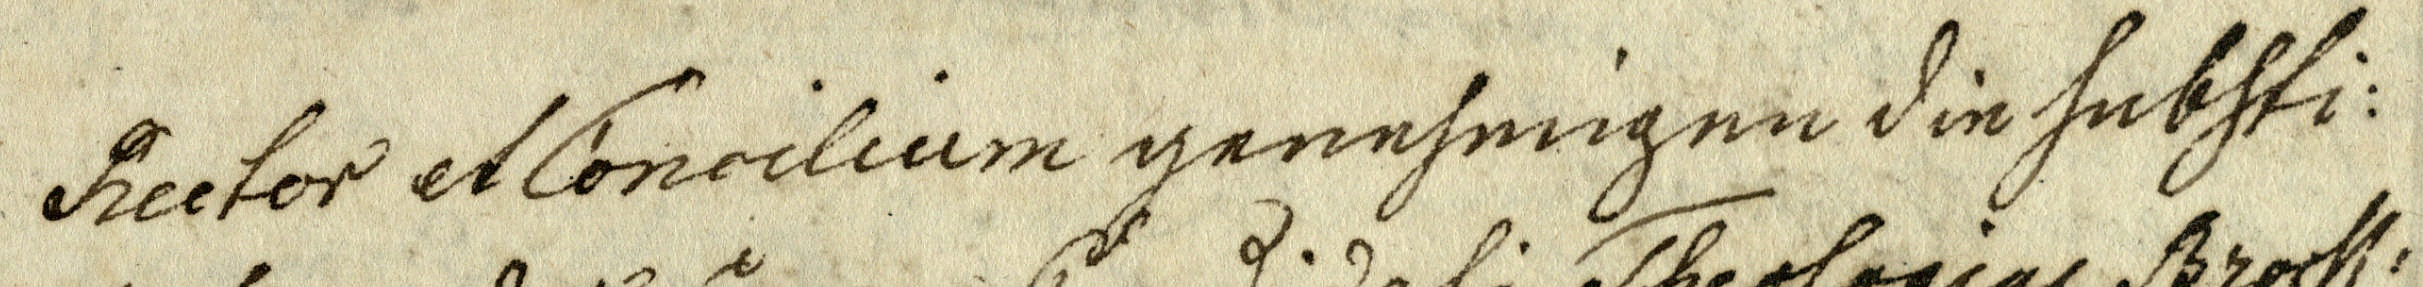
Rector et Concilium genehmigen die substi¬
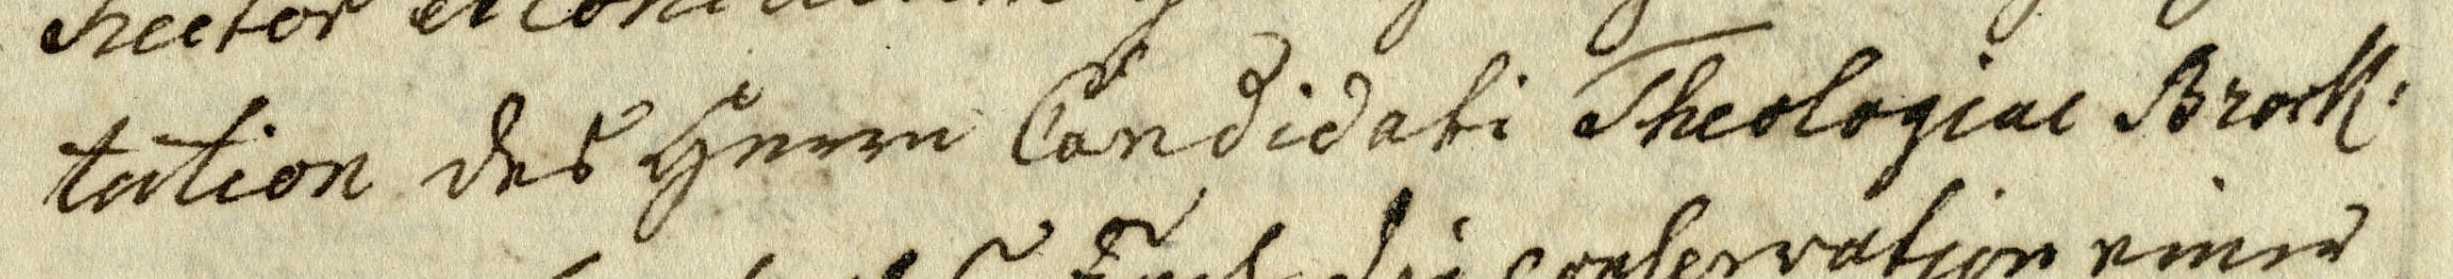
tution des Herrn Candidati Theologiae Brock¬
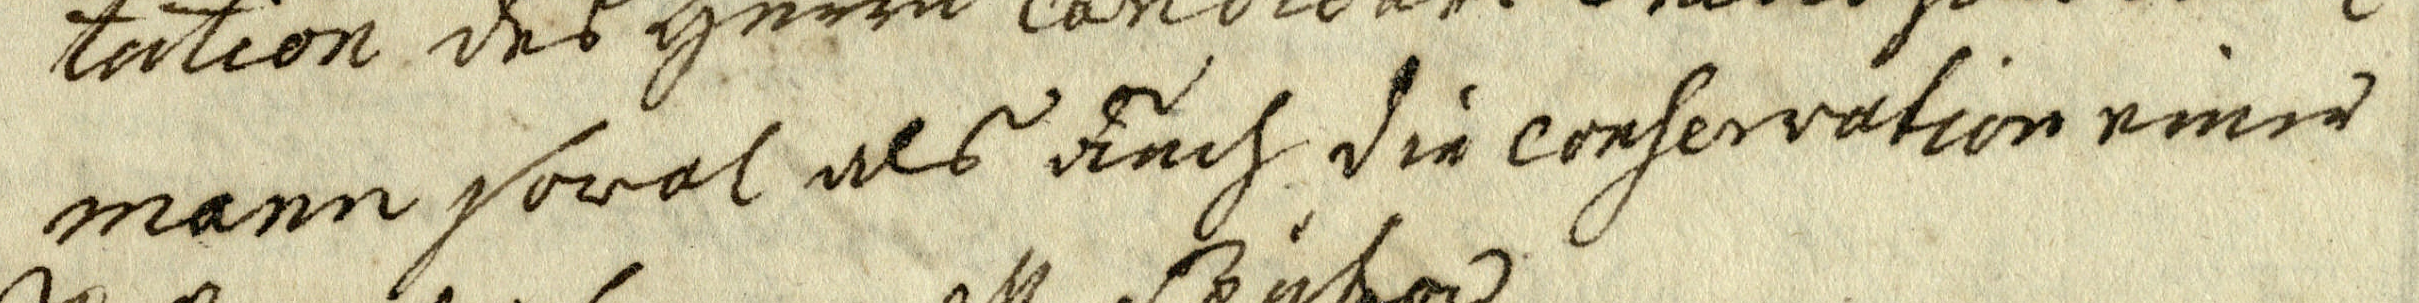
mann sowol als auch die conservation einer
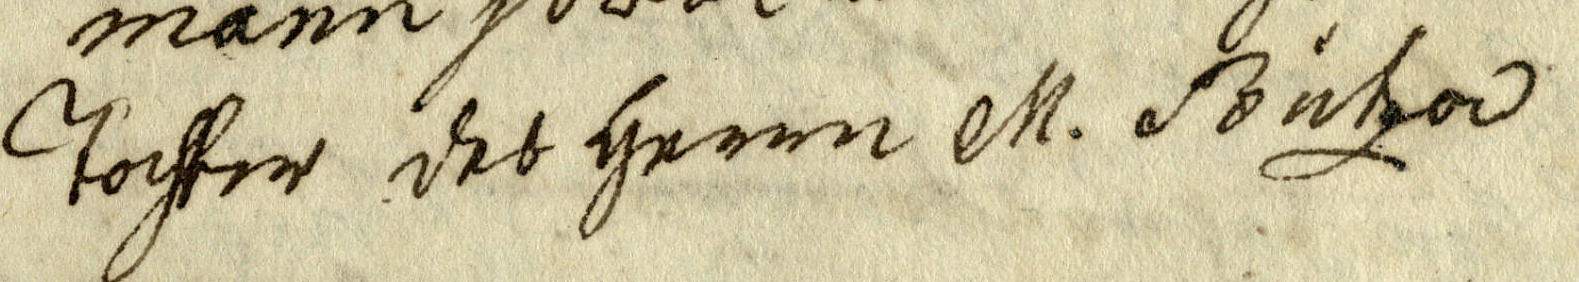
Tochter des Herrn M. Bützow
